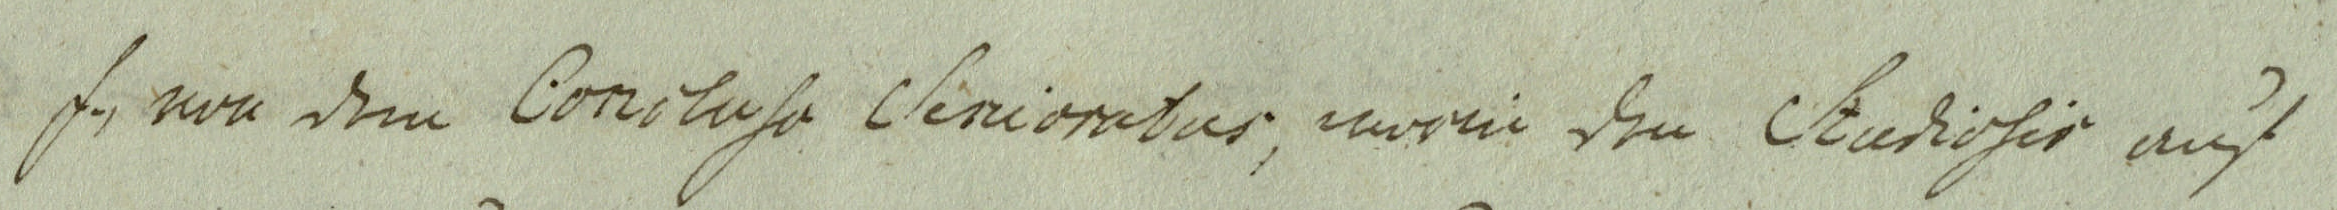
f., von dem Cocluso Senioratus, worin den Studiosis auf
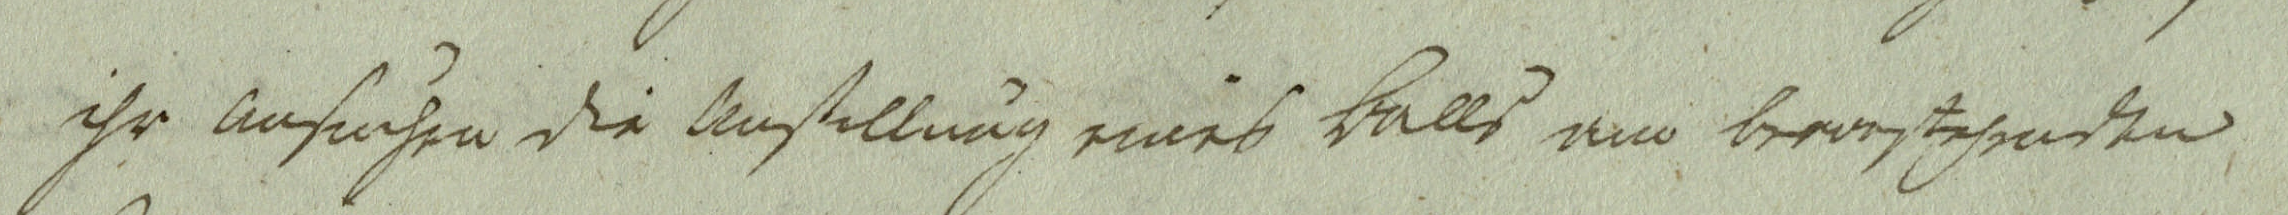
ihr Ansuchen die Anstellung eines Balls am bevorstehenden
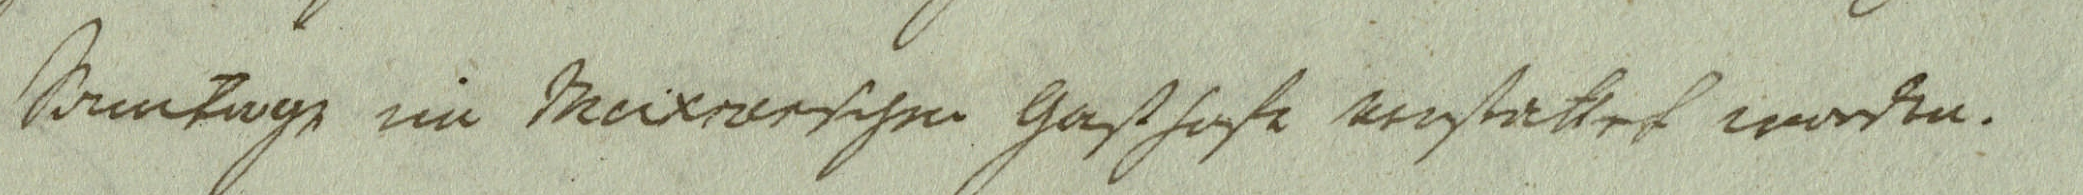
Sonntage im Meixnerschen Gasthofe verstattet worden.
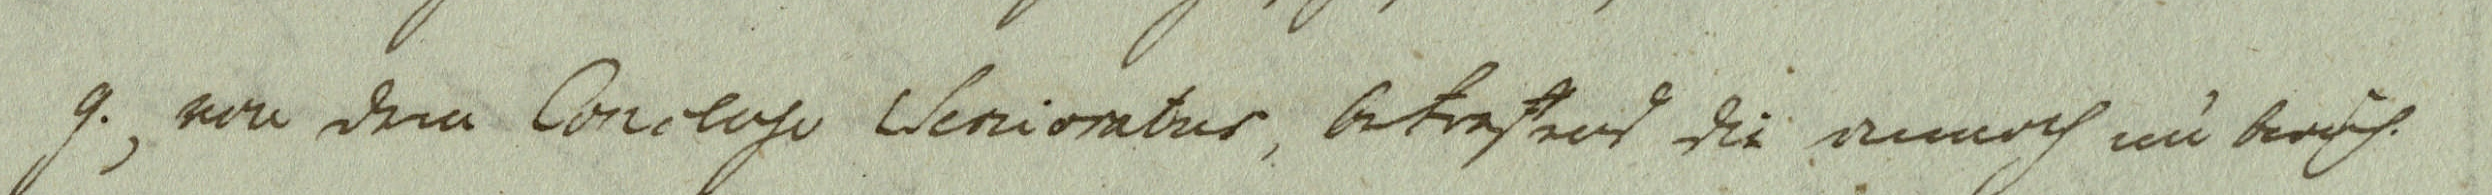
g., von dem Concluso Senioratus, betreffend die annoch un berech¬
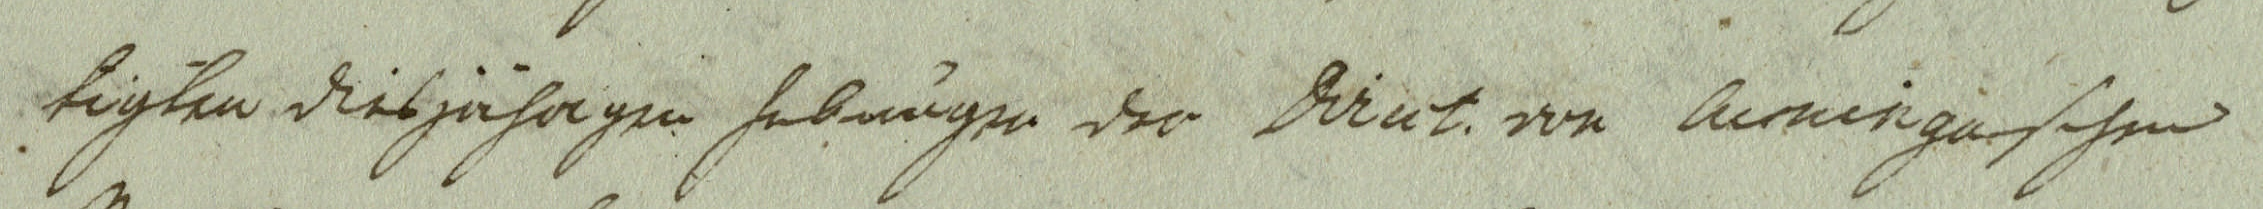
tigten diesjährigen hebungen der Direct. von Aemingaschen
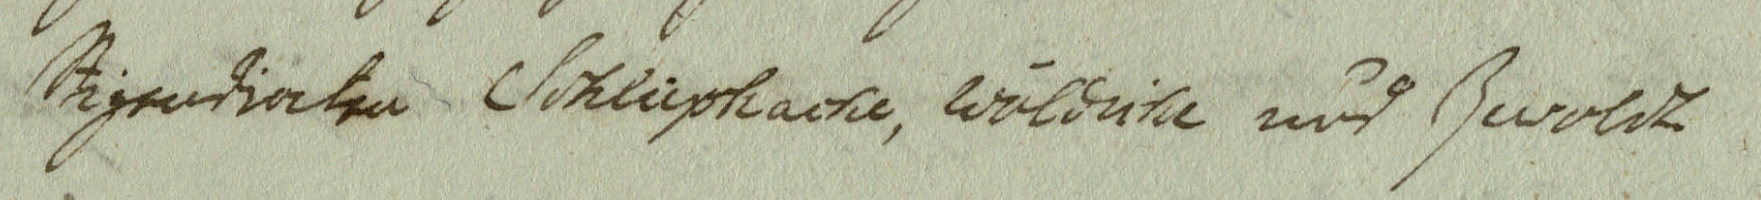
Stipendiaten Schluphacke, Wöldicke und Rewoldt.
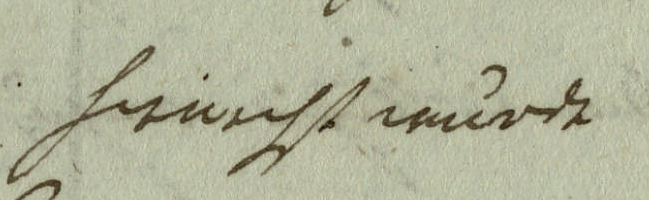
hienechst wurde
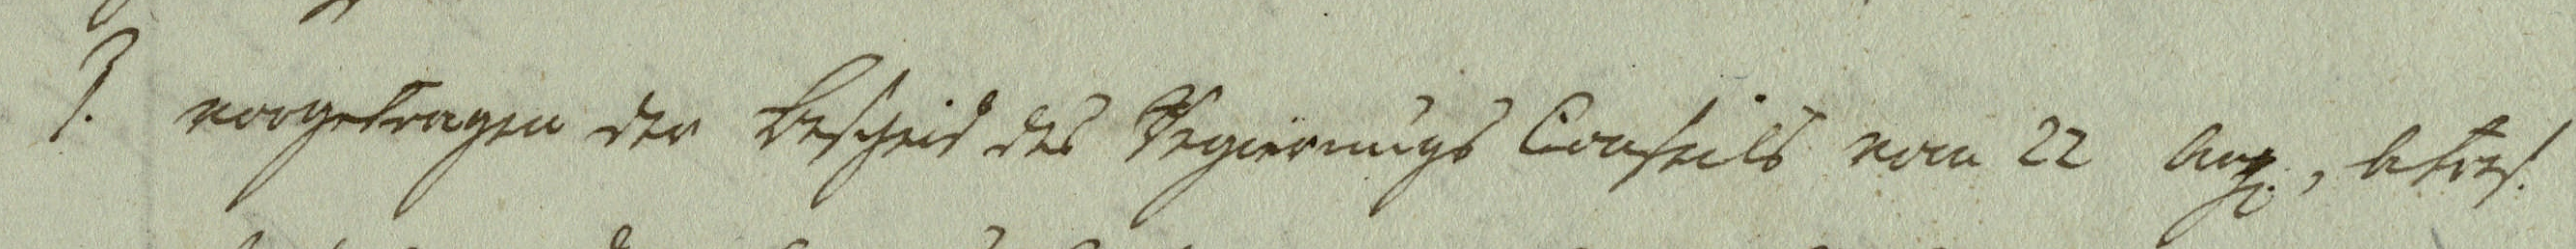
1. vorgetragen der Bescheid des Regierungs Conseils vom 22. Aug. betref¬
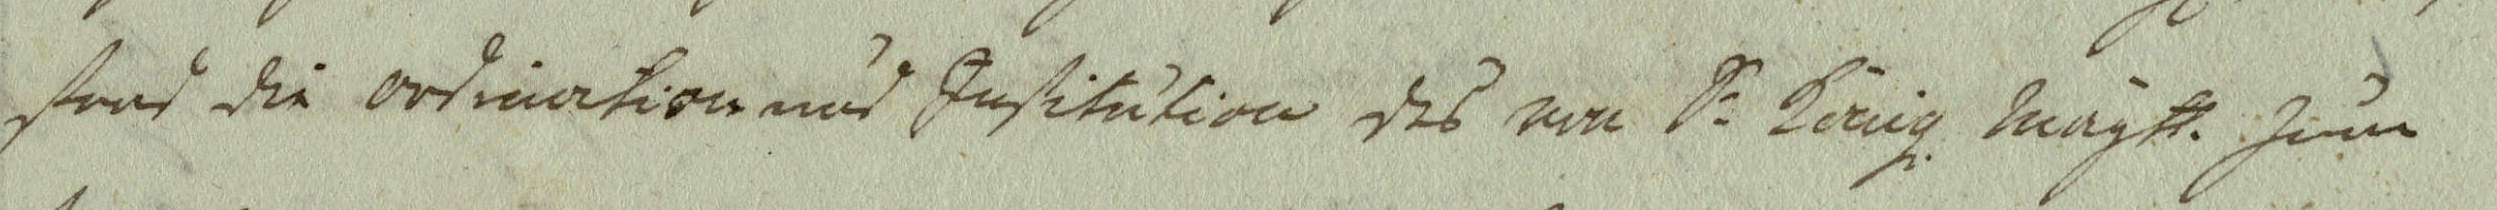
fend die ordination und Institution des von Sr. Königl. Maÿtt. zum
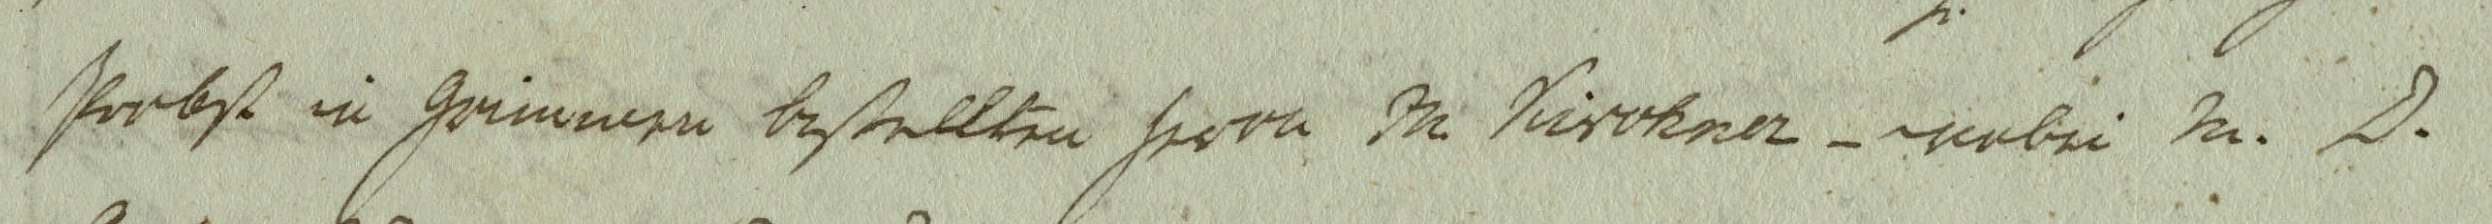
Probst in Grimmen bestellten herrn M Kirchner wobei M. D.
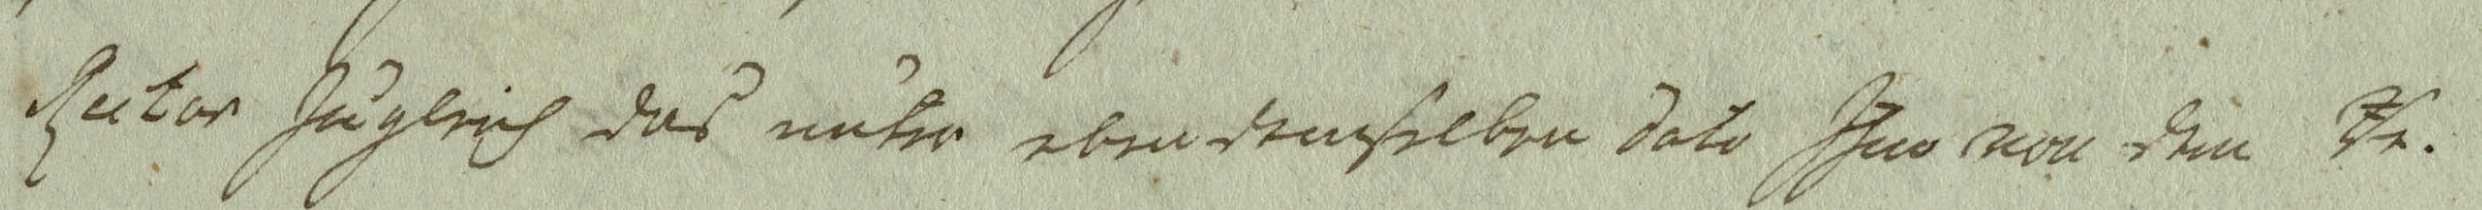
Rector zugleich das unter eben demselben dato Ihm von dem Re¬
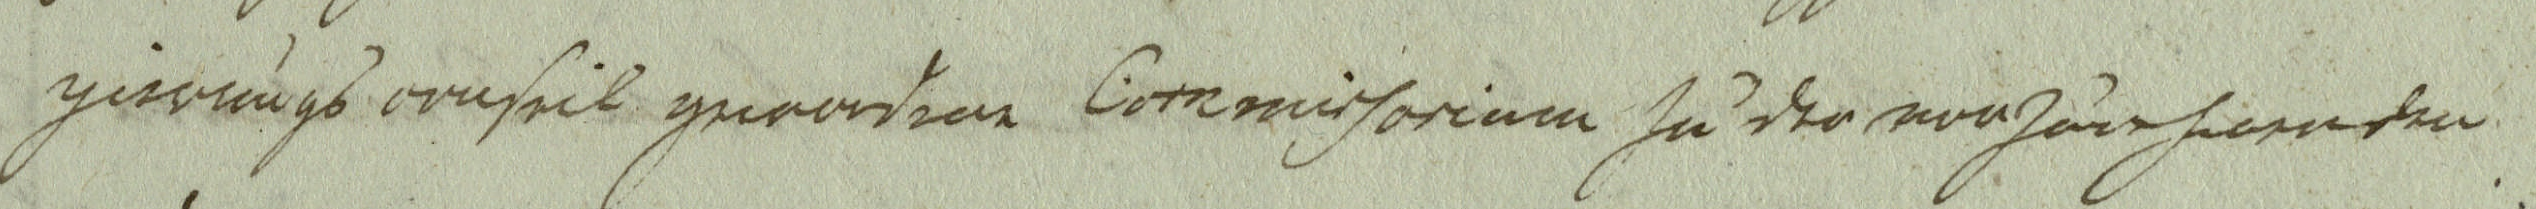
gierungs conseil gewordene Commissorium zu der vorzunehmenden
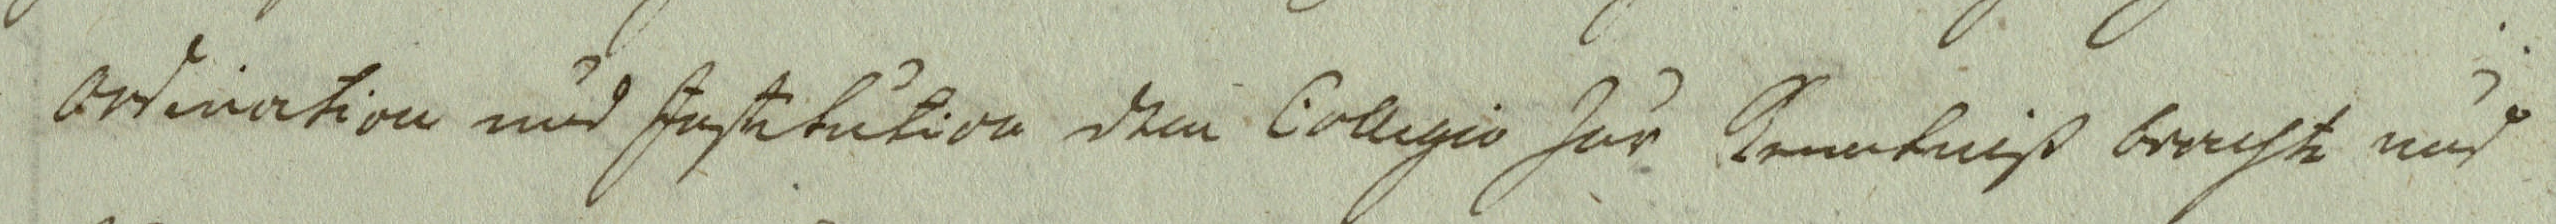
ordination und Institution dem Collegio zur Kenntniß brachte und
